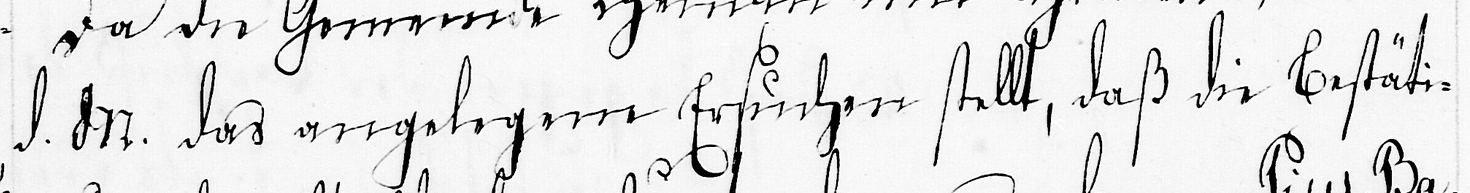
d. M. das angelegene Ersuchen stellt, daß die Bestäti¬
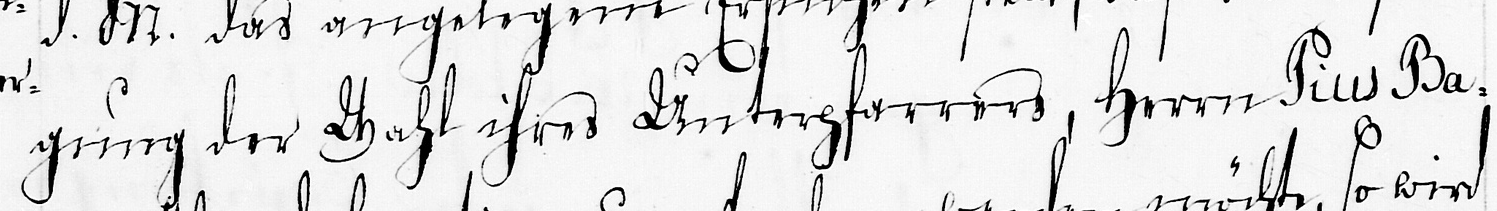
gung der Wahl ihres Unterpfarrers, Herrn Pius Ba¬
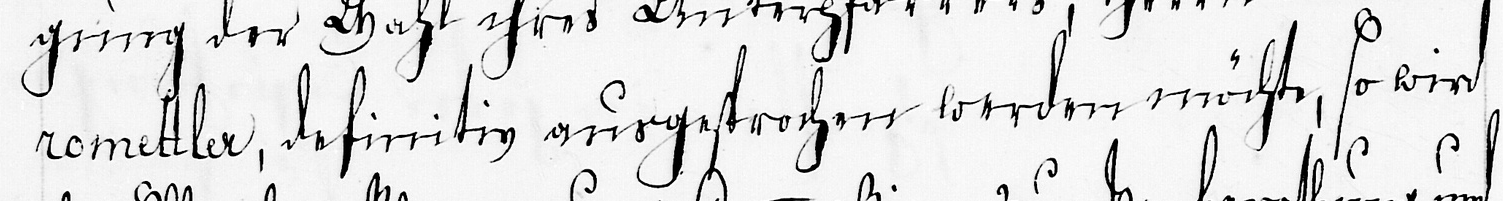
romettler, definitiv ausgesprochen werden möchte, so wird
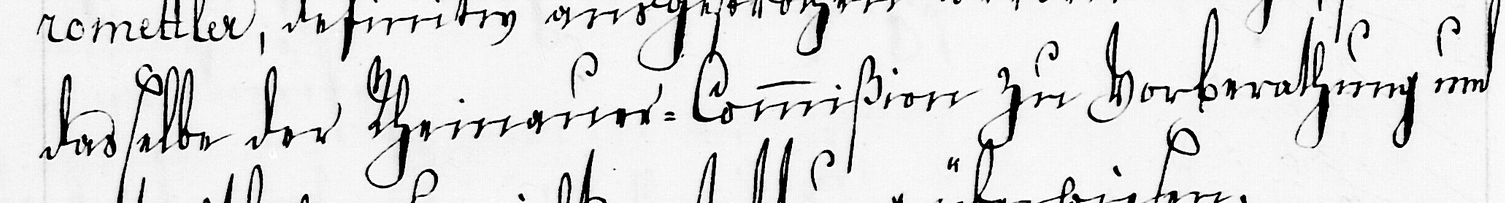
dasselbe der Rheinauer-Commißion zu Vorberathung und
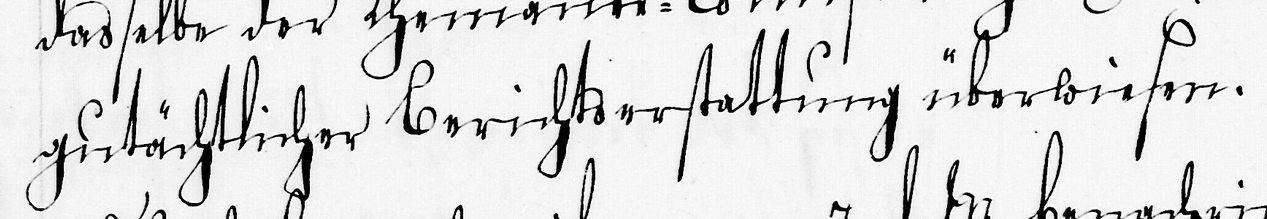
gutächtlicher Berichtserstattung überwiesen.
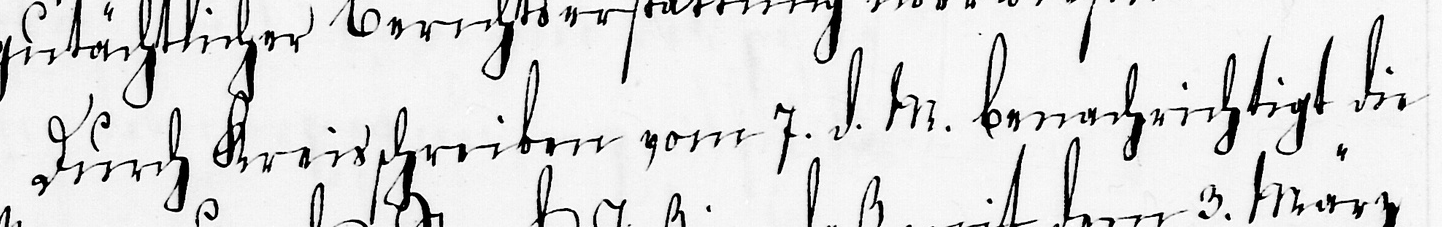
Durch Kreisschreiben vom 7. d. M. benachrichtigt die
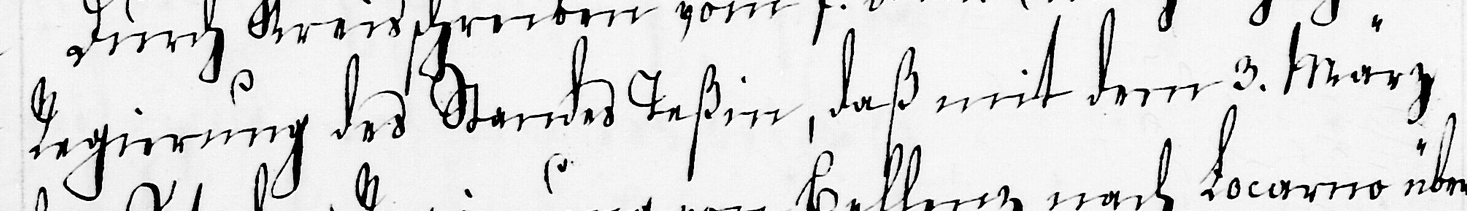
Regierung des Standes Teßin, daß mit dem 3. März
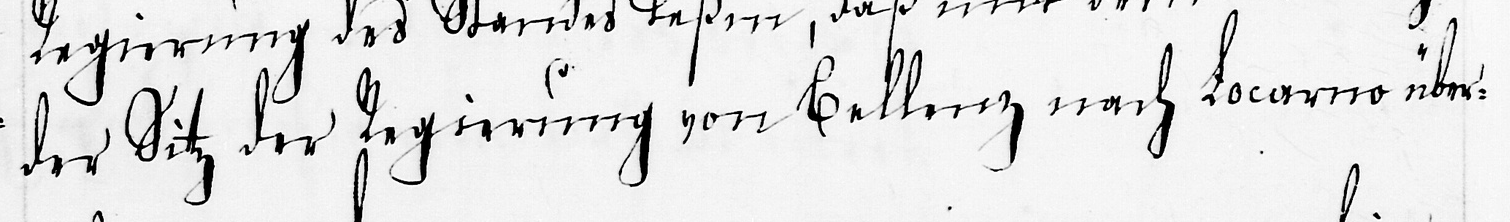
der Sitz der Regierung von Bellenz nach Locarno über¬
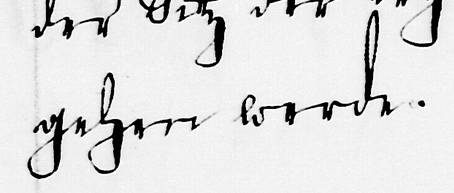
gehen werde.
